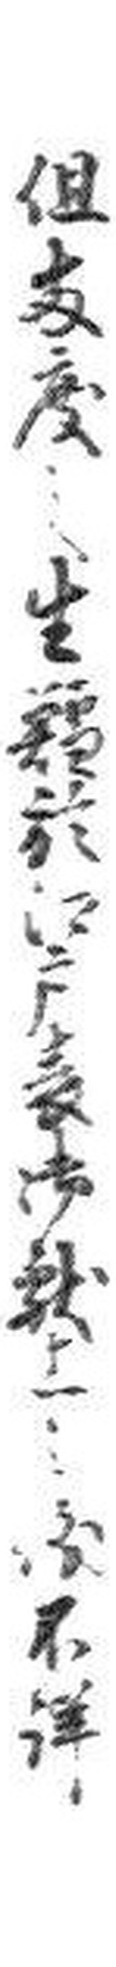但両度之生鱈於江戸表御献上之儀不詳
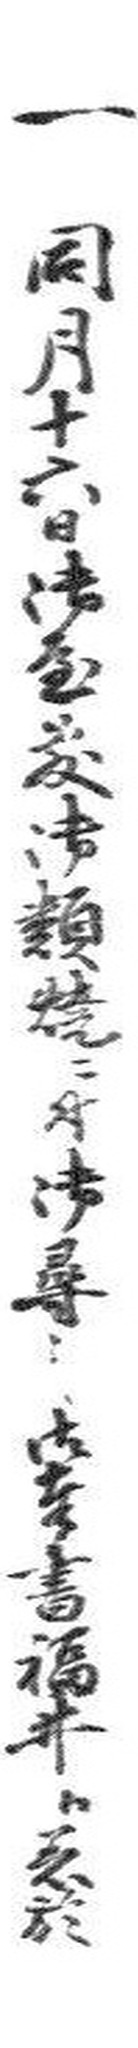一同月十六日御屋敷御類焼ニ付御尋之御奉書福井江着於
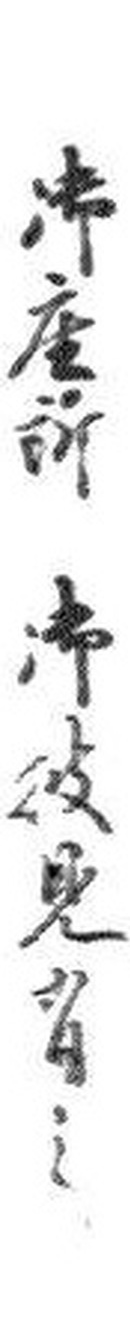御座所御披見有之
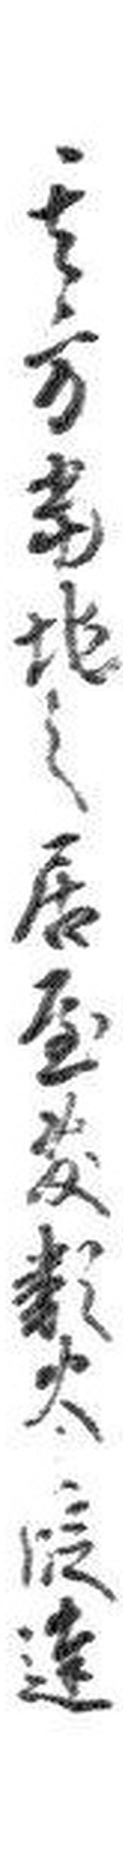其方当地之居屋敷類火之段達

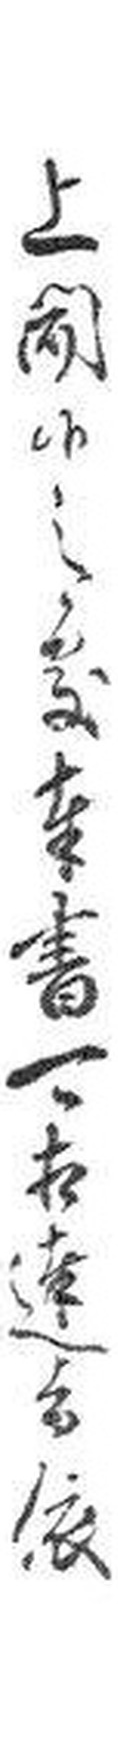上聞候之処奉書可相達旨依
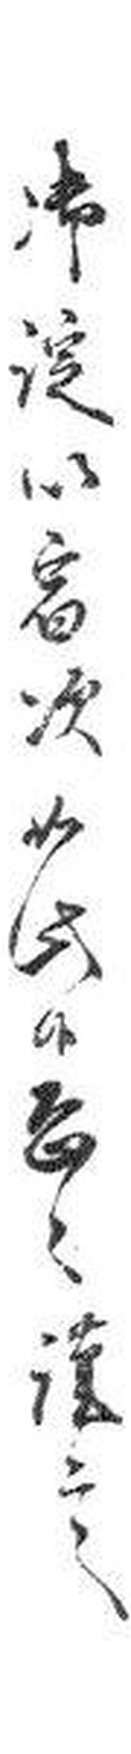御諚以宿次如此候恐々謹言
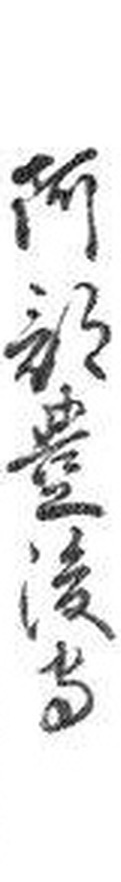阿部豊後守
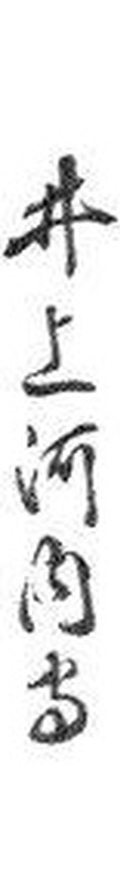井上河内守
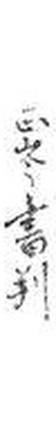正岑書判
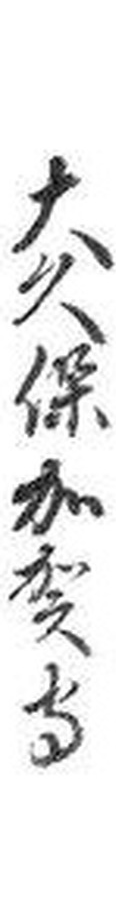大久保加賀守
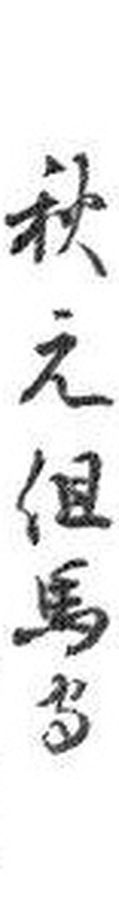秋元但馬守
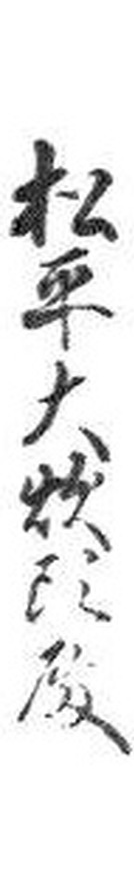松平大炊頭殿
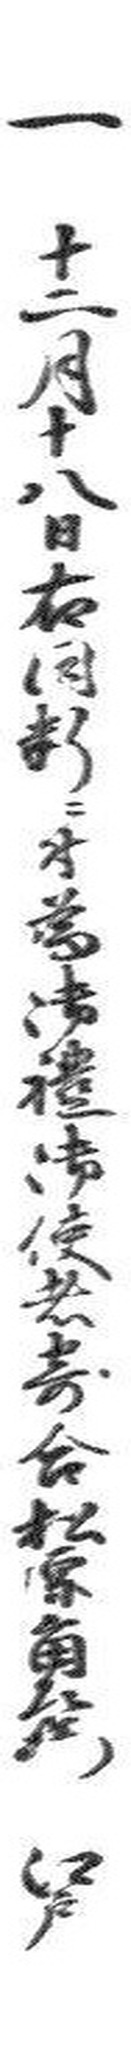一十二月十八日右同断ニ付為御礼御使者寄合松原角左衛門江戸
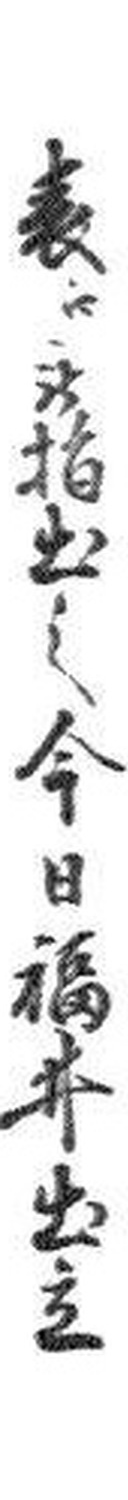表江被指出之今日福井出立
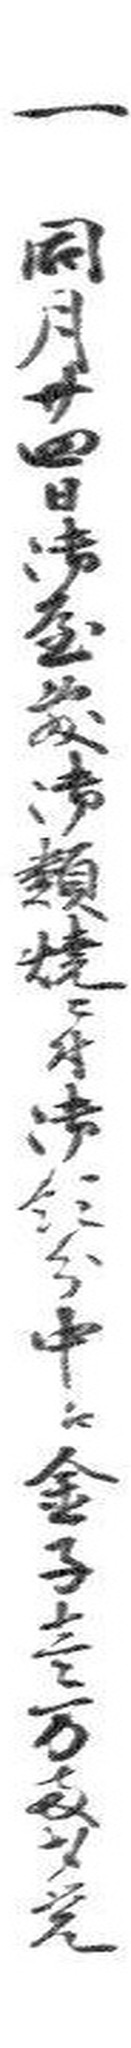一同月二十四日御屋敷御類焼ニ付御領分中江金子壱万両才覚
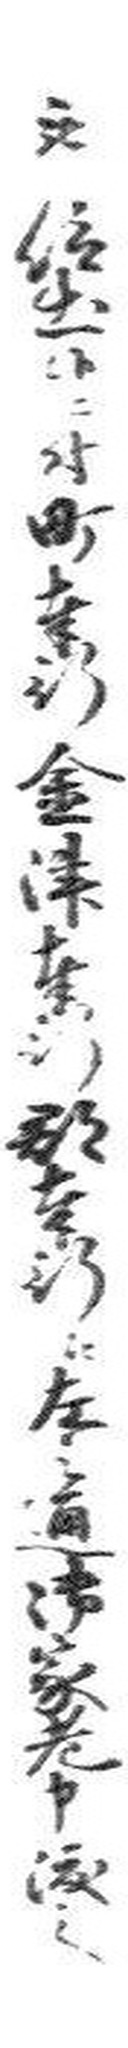被仰出候ニ付町奉行金津奉行郡奉行江左之通御家老申渡之
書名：家譜 二十八 吉邦公 従宝永七年七月五日到正徳元年十二月
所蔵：福井県文書館 Fukui Prefectural Archives
